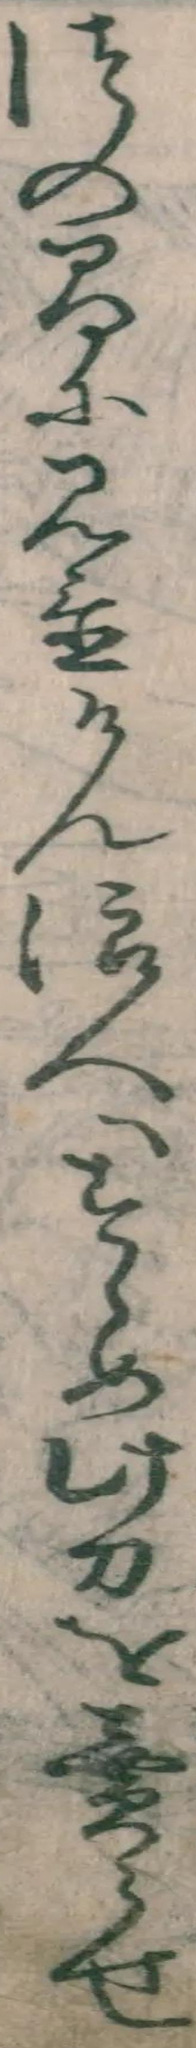つの間に見置けん浪人へすゝめ此刀を売せ
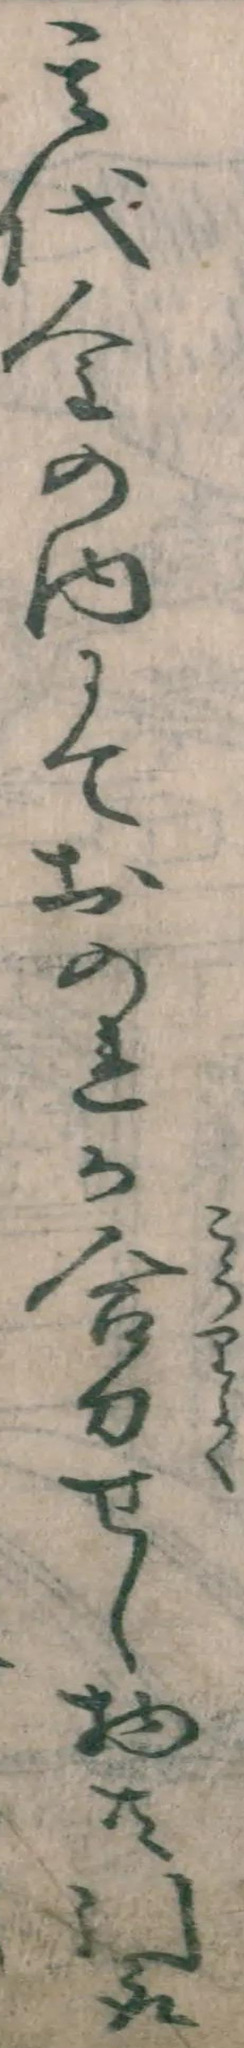其代金の中にておのれか合力せし物共引取
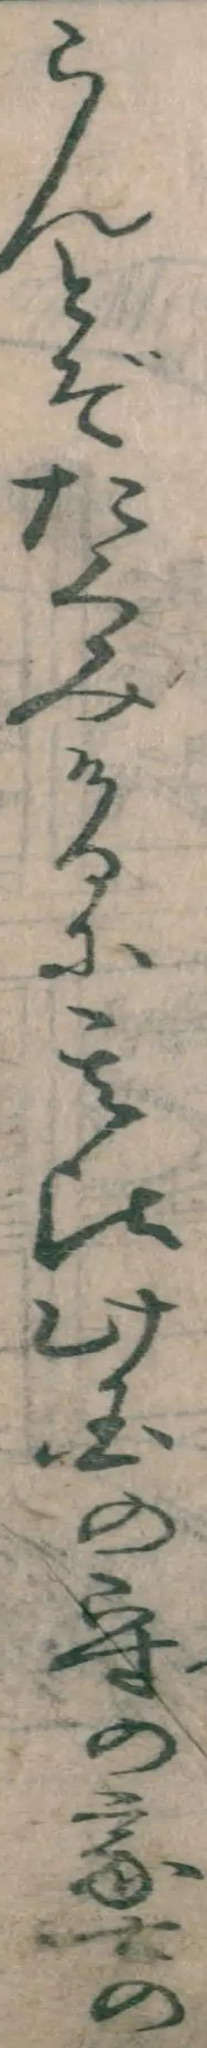らんとぞたくみけるに其頃此国の守の家士の

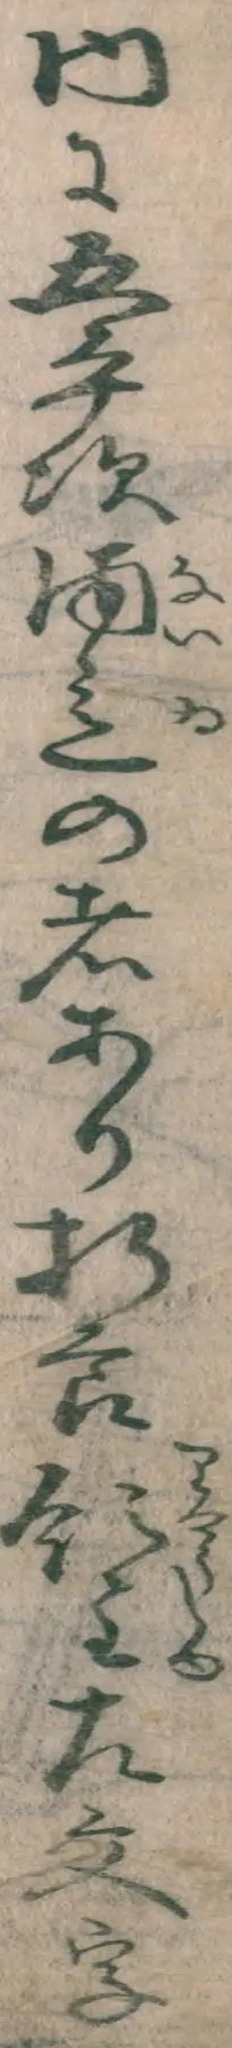内に五平次内意の者あり折節領主左文字
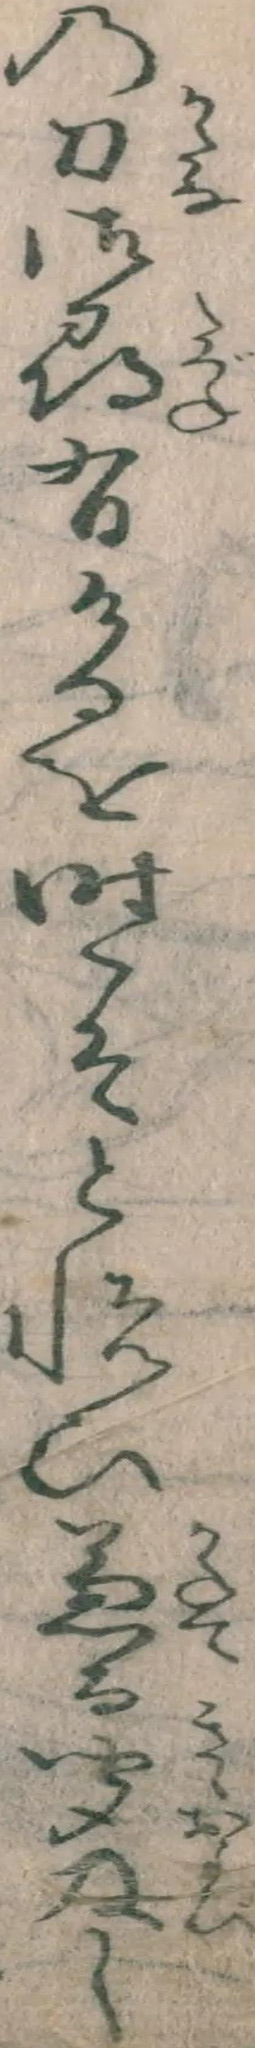の刀御尋有けるを時こそと悦ひ兼而聞及し
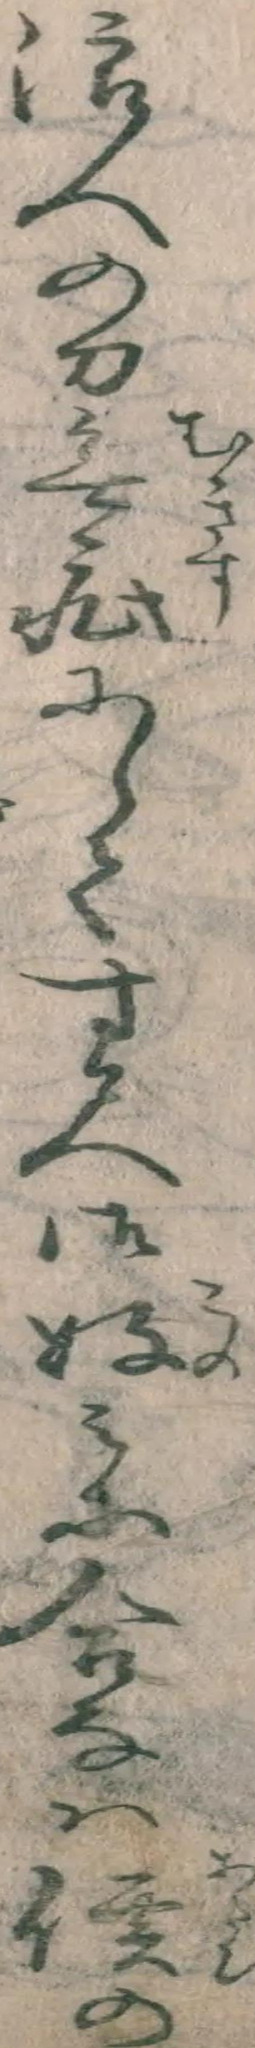浪人の刀無疵にしてすく御好みに合なは価の
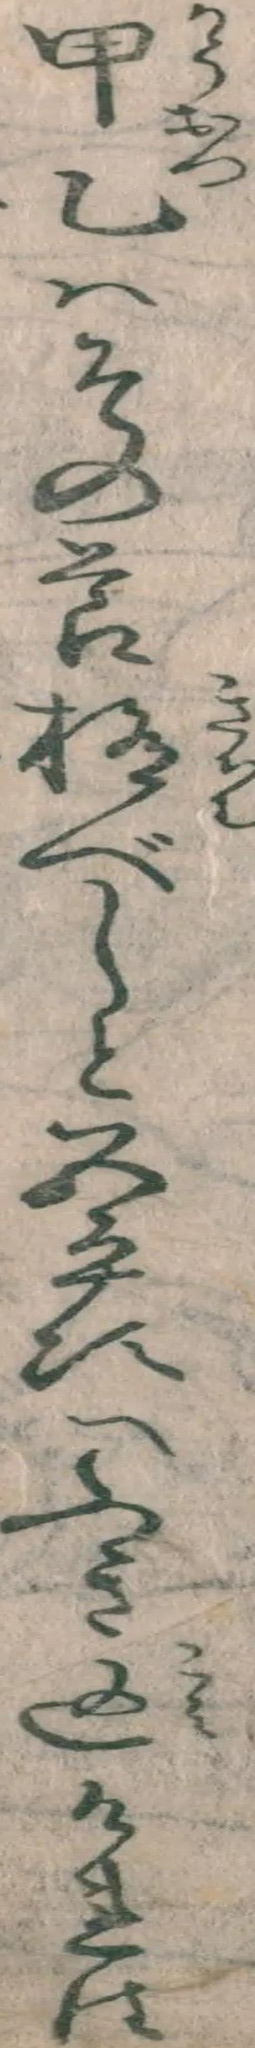甲乙はその節極べしと五平次へふき込けれは
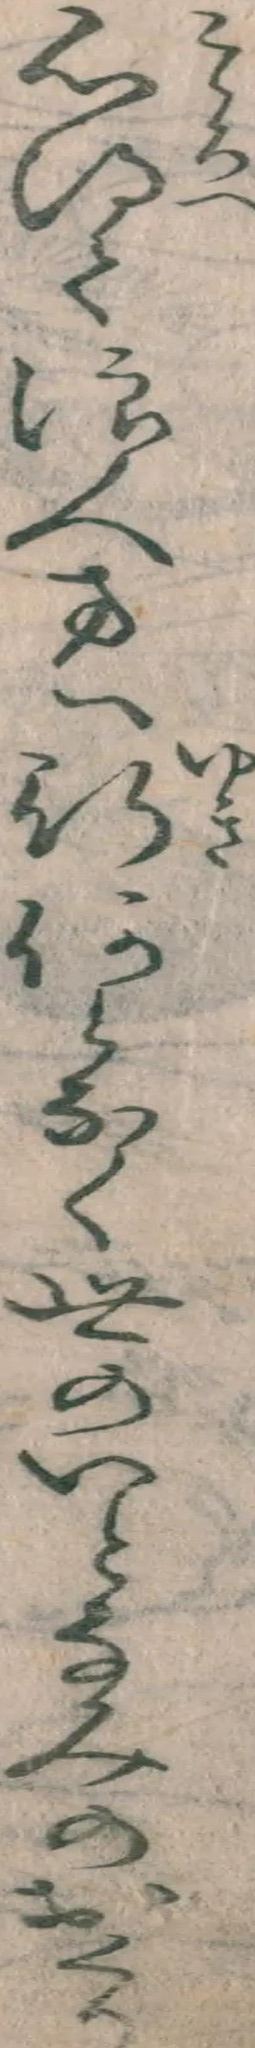心得て浪人方へ行何となく世のいとなみのおくり
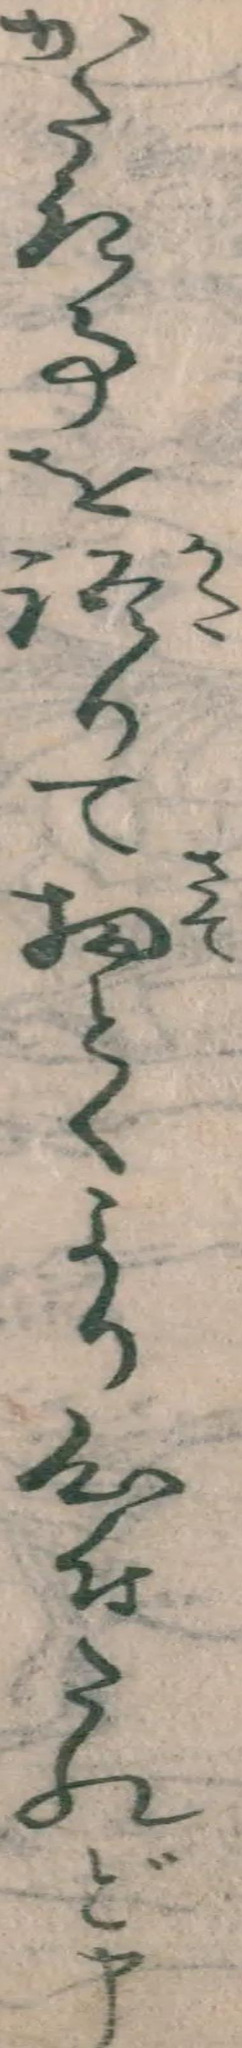かたき事を語りて扨とくより心付たれど申
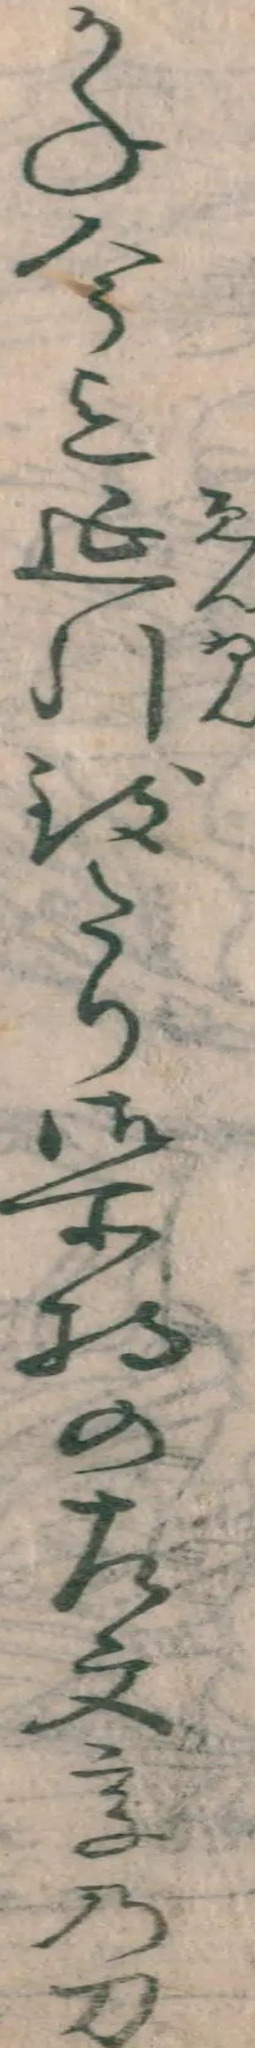かね今迄延引致たり御所持の左文字の刀
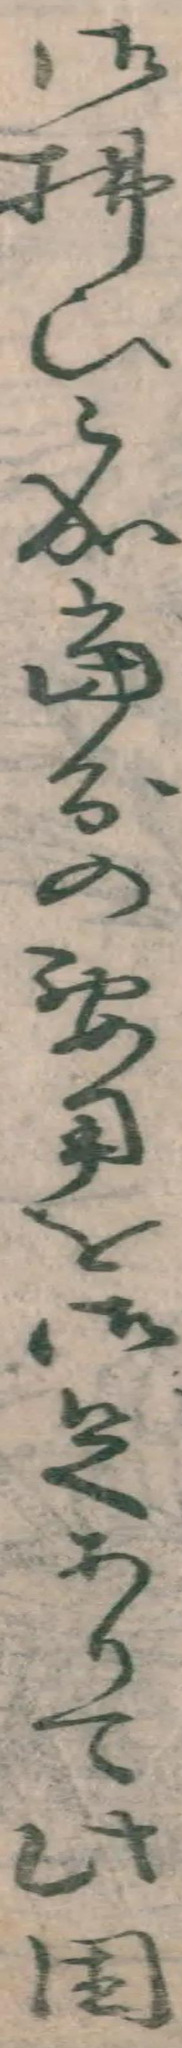御払ひ被成当分の要用を御足ありて此困
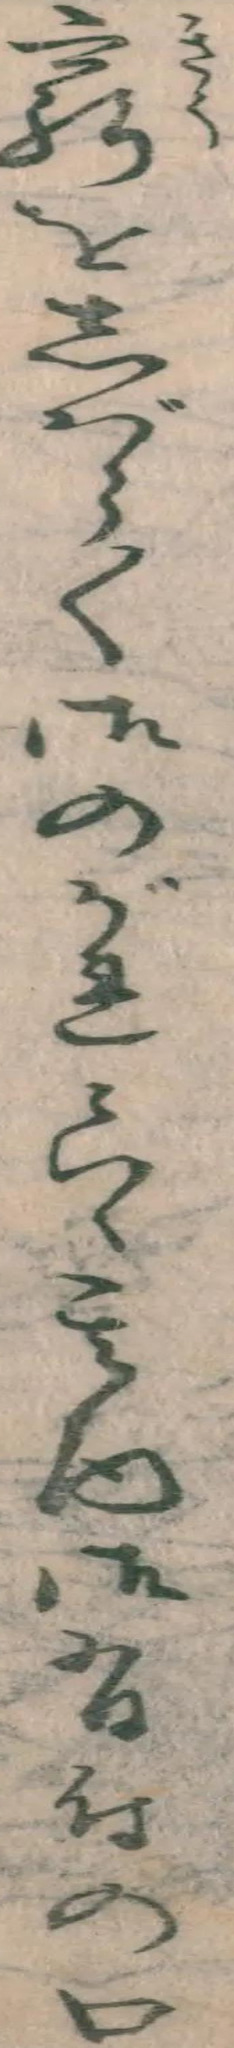窮をしばらく御のがれ候はゝ其内御有付の口
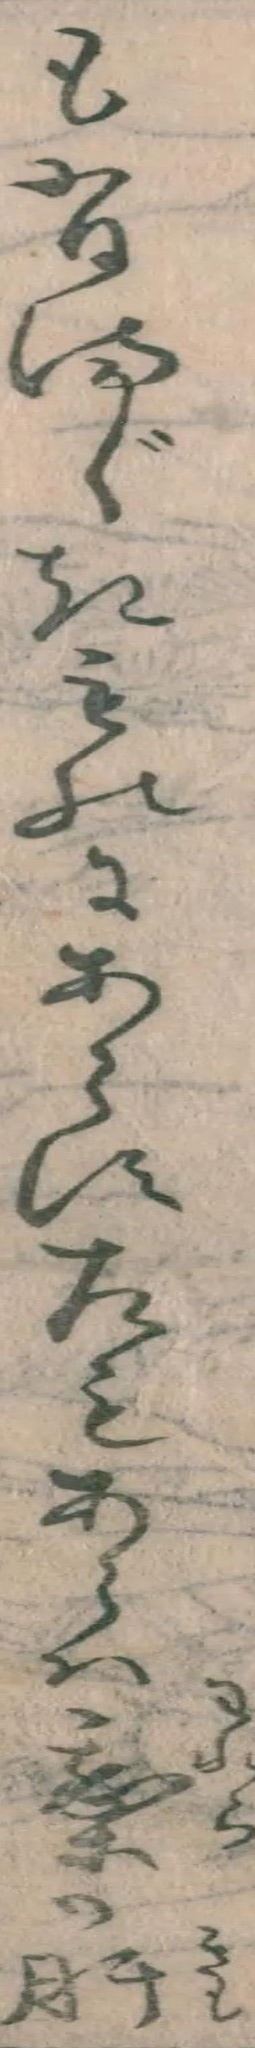も有まじきものにあらずさもあらは我等の肝
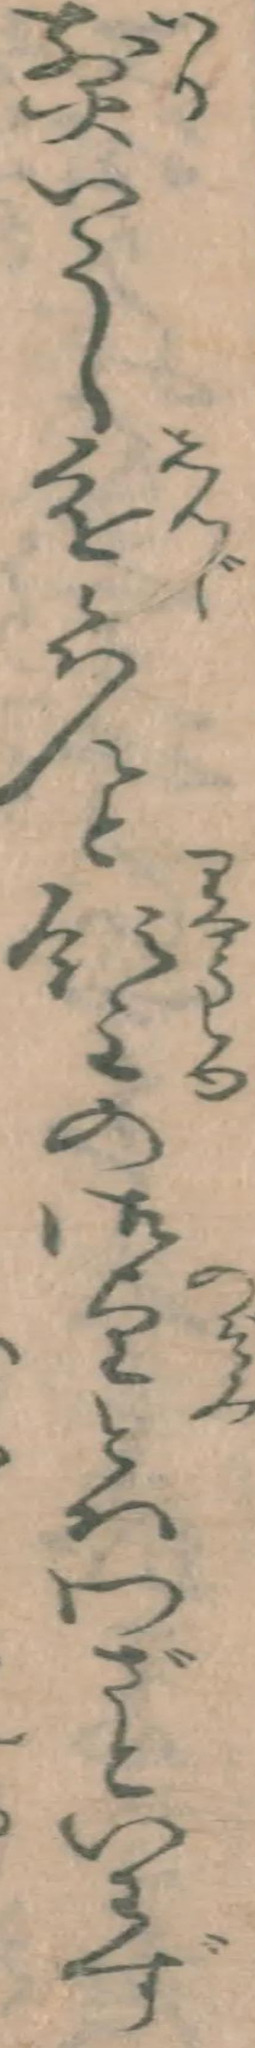煎いたし進候はんと領主の御望とはわざといわず
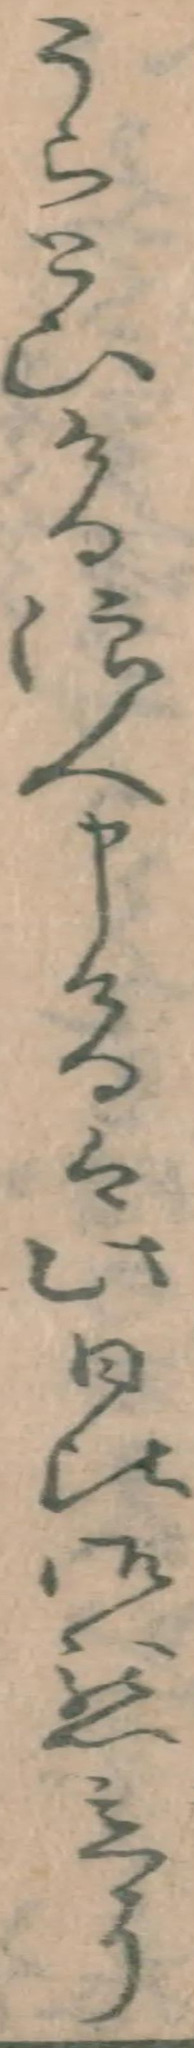うらとひける浪人申けるは此日頃御懇意に
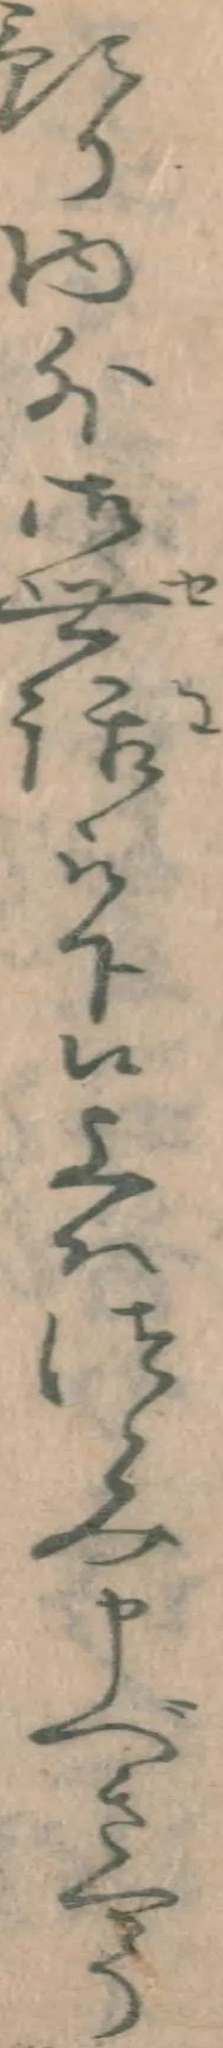預り内外御世話被下候上はつゝみ申べきやう
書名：怪談御伽童 5巻. [2]
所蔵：国立国会図書館 National Diet Library, JAPAN
